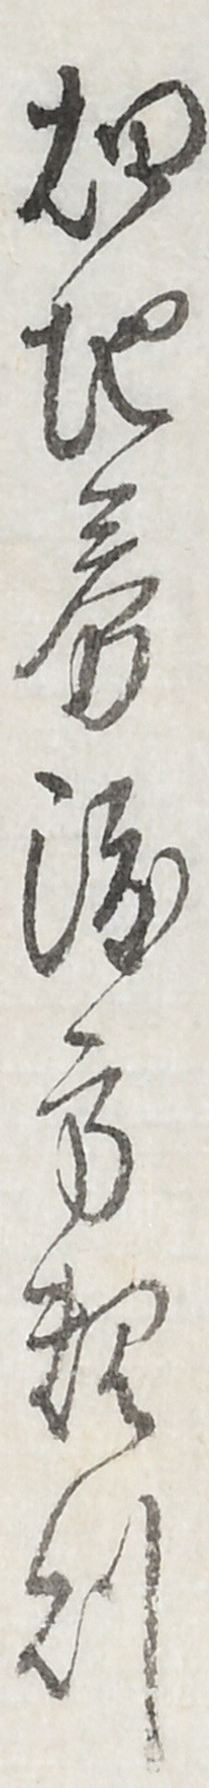畑地券渡方規則
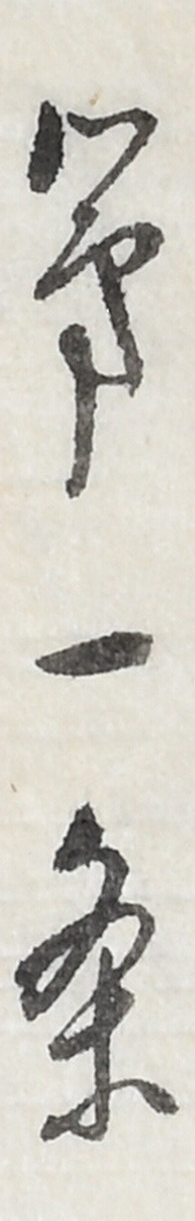第一条
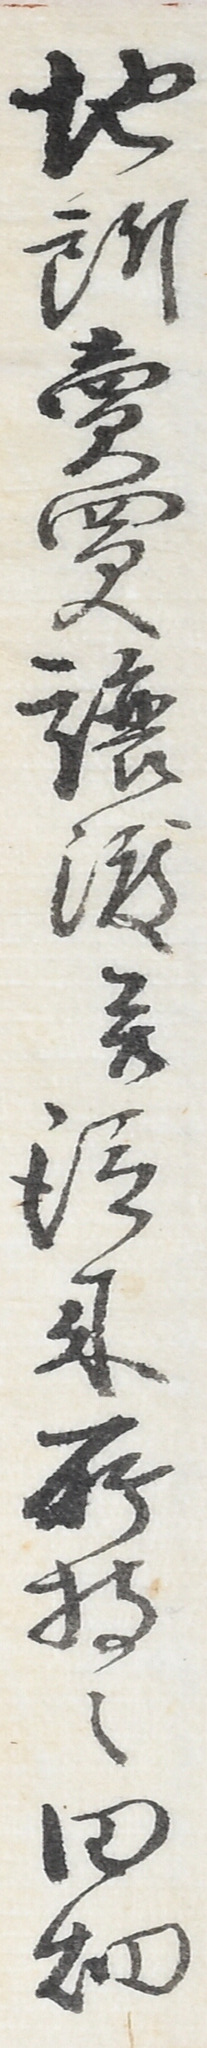地所売買譲渡幷従来所持之田畑

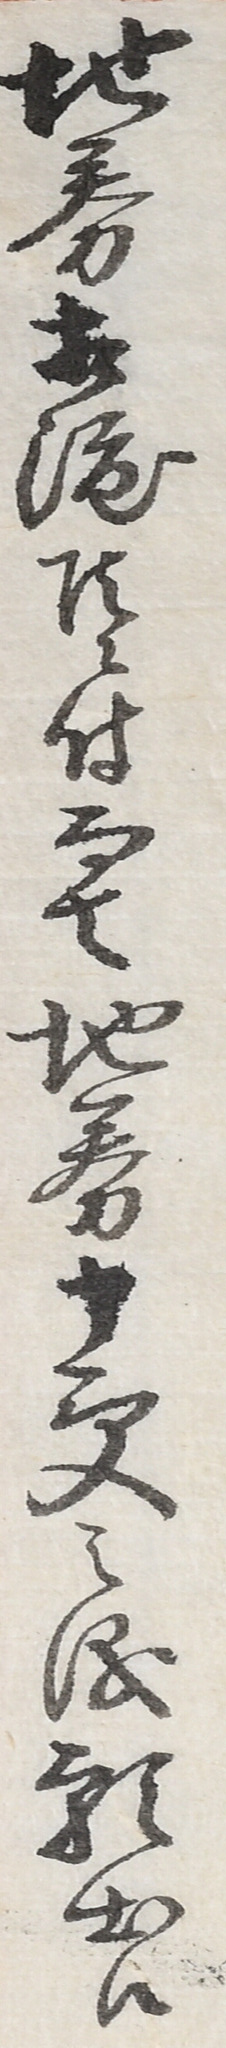地券相渡候ニ付而は地券申請之儀願出候
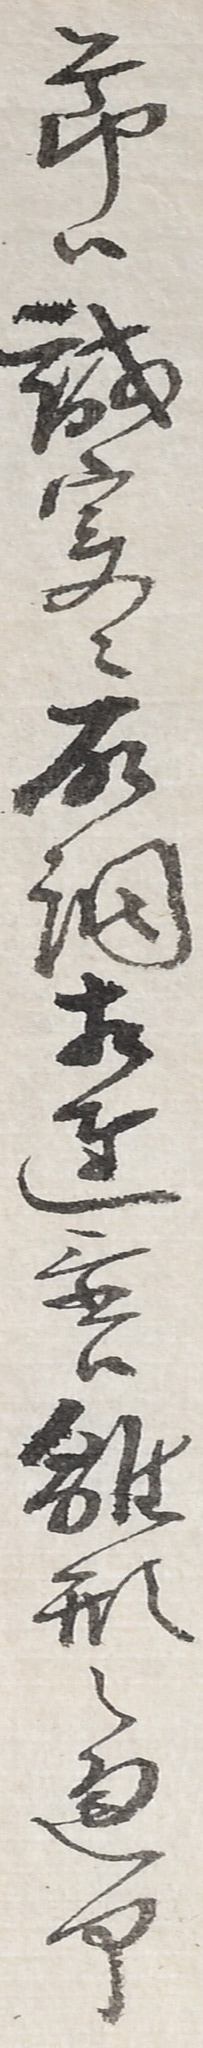節ハ誠実ニ取調相達置候雛型之通可
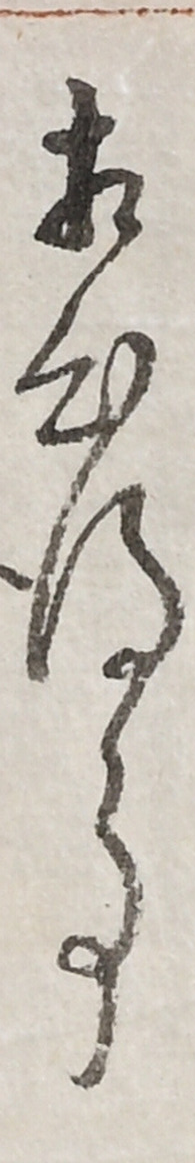相心得事
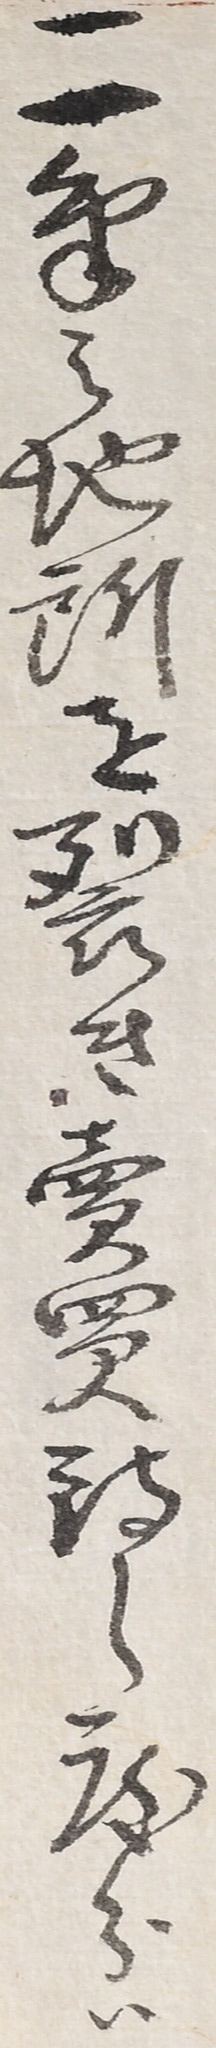一一筆之地所を裂き売買致し度分ハ
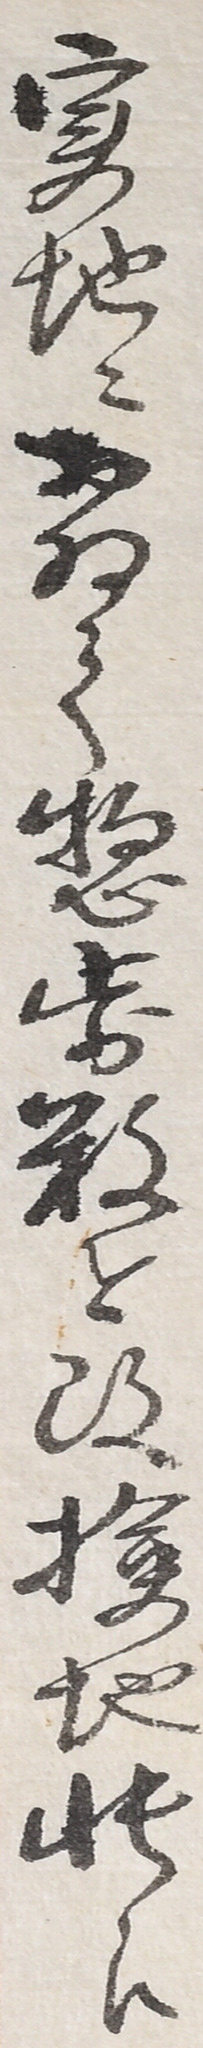実地ニおゐて惣歩数を改検地帳え
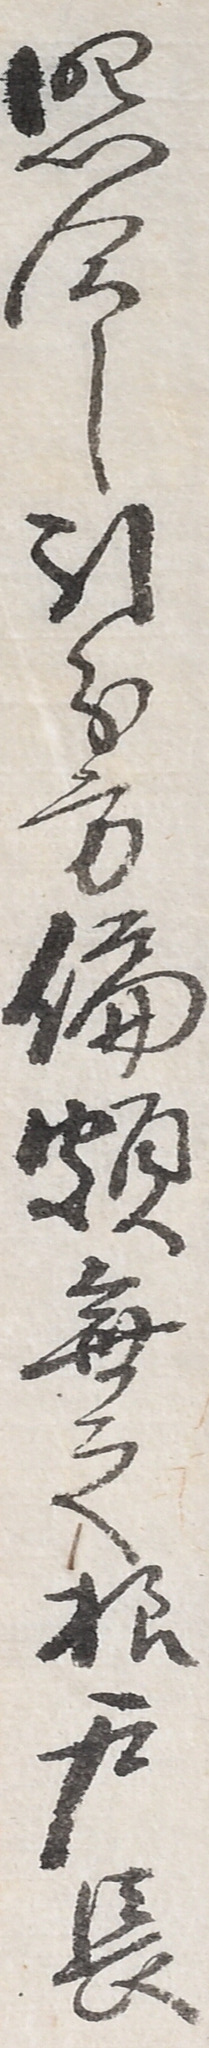照会し引分方偏頗無之様戸長
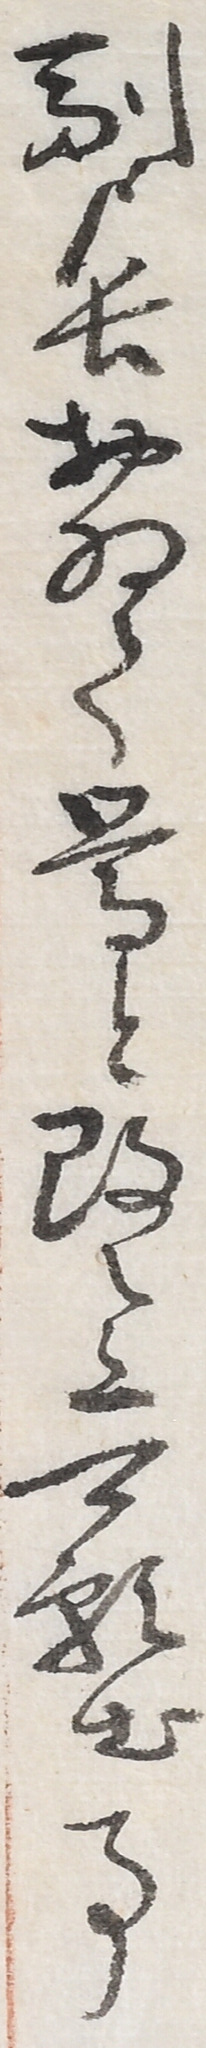副戸長おゐて等と改候上可願出事
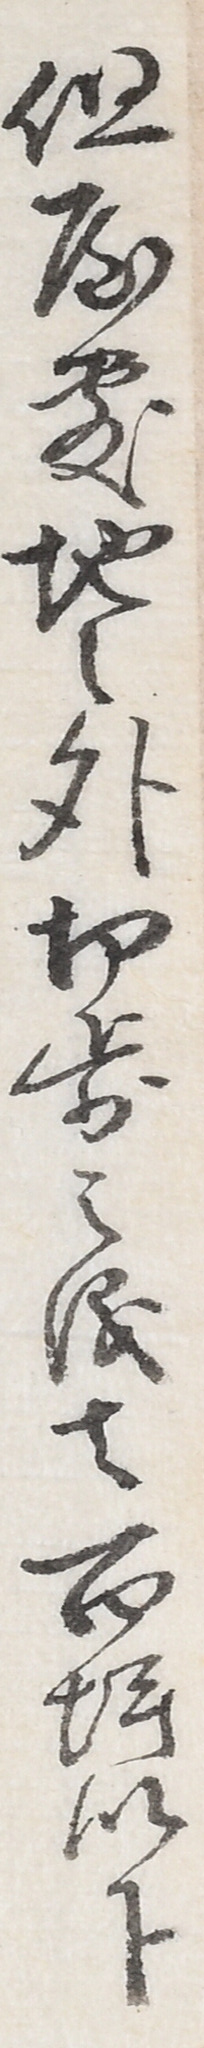但屋敷地之外切歩之儀は百坪以下
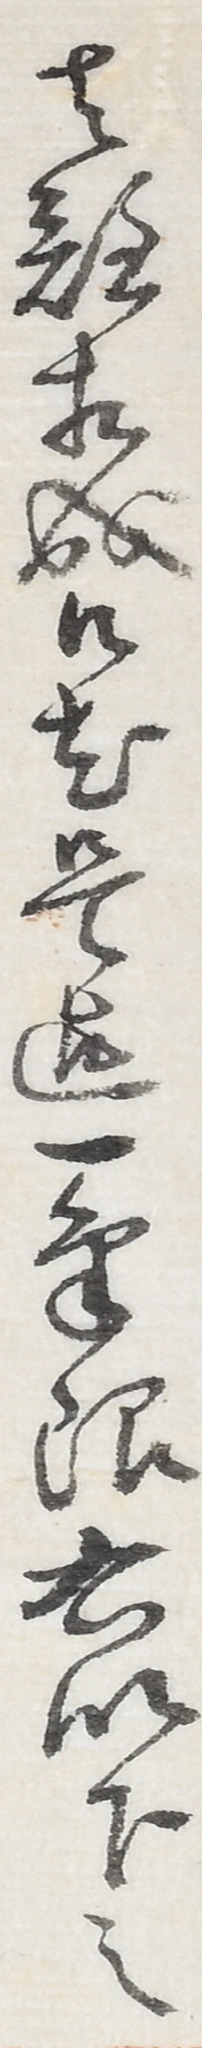は難相成候尤是迄一筆限右以下之
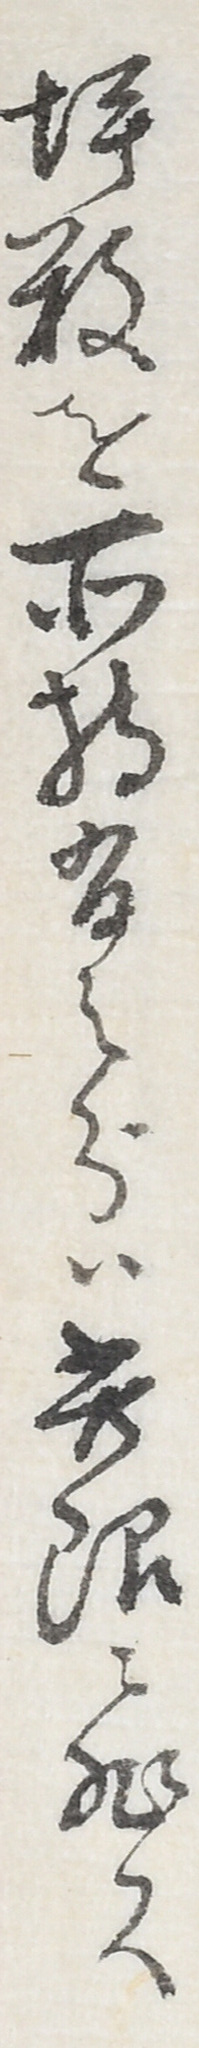坪数を所持有之分ハ此限ニ非ス
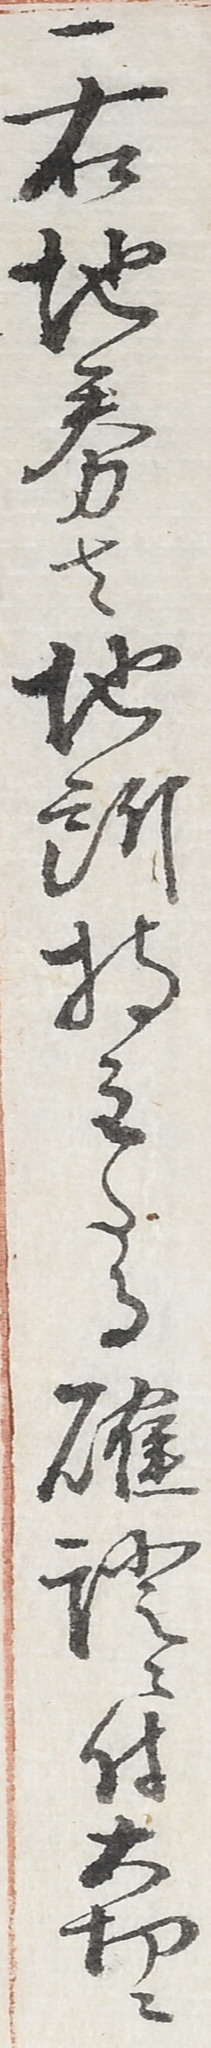一右地券は地所持主たる確証ニ付大切ニ
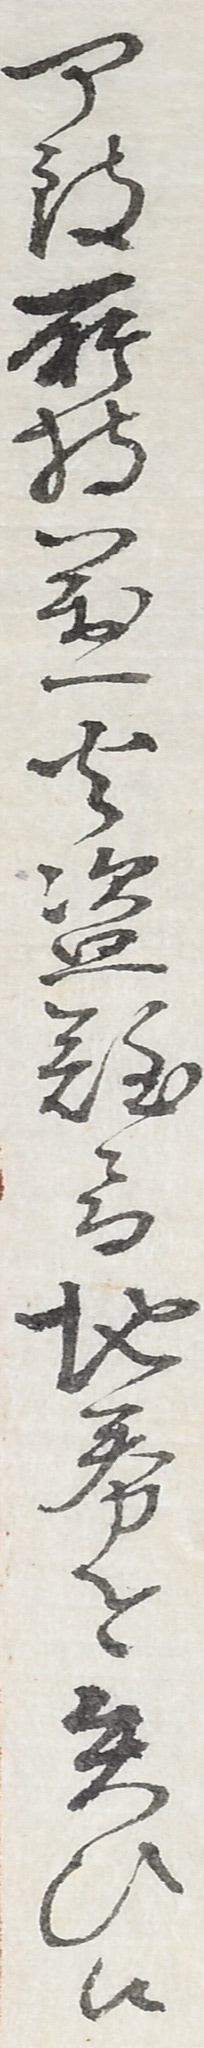可致所持万一火盗難ニ而地券を失ひ候
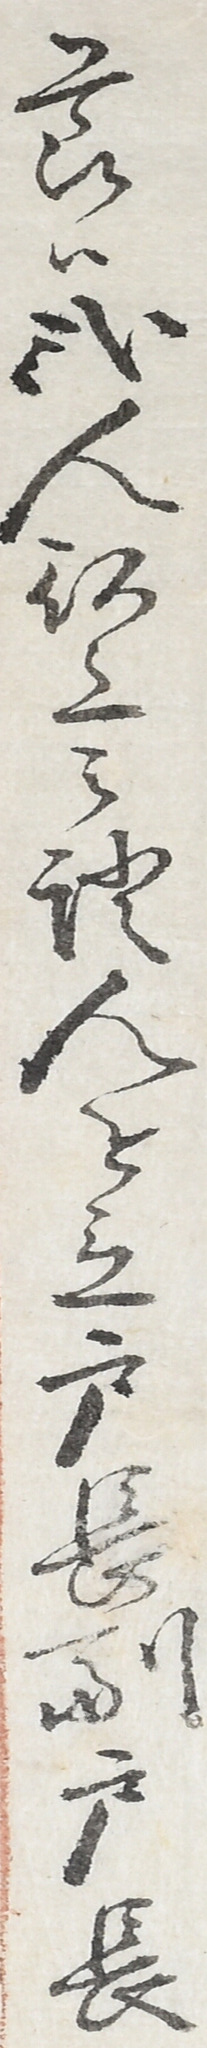節ハ弐人以上之証人を立戸長副戸長
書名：壹番・御布告一式
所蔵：伊那市立高遠町図書館・合同会社AMANE
